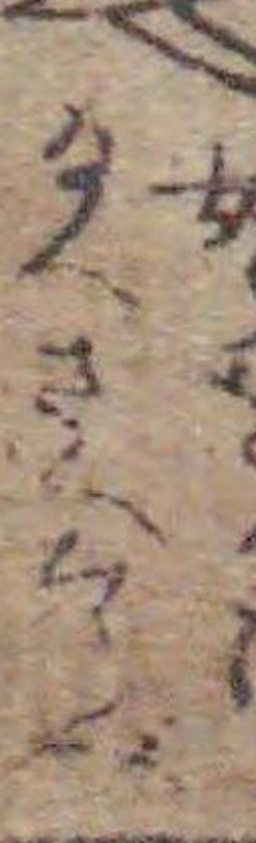給？へさへくらべ
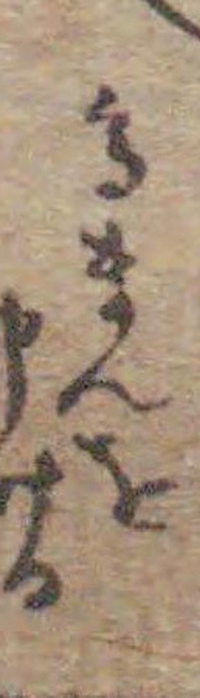高まんを

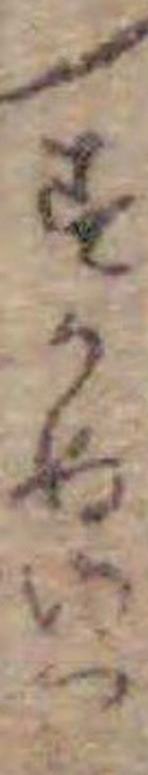すかぬいや
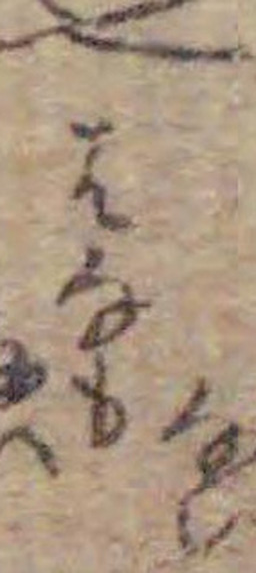はなも
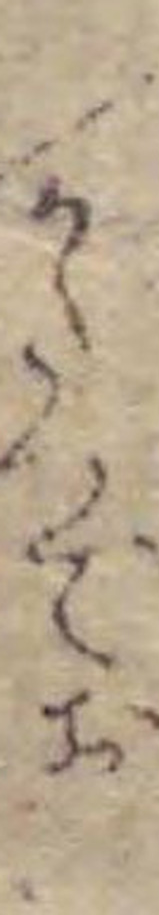かたつてお
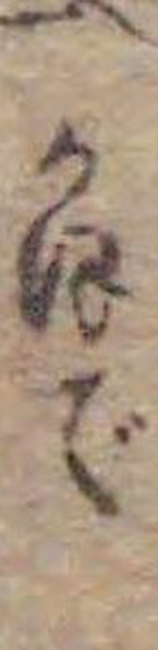かほで
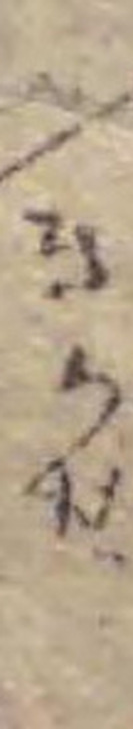きかせ
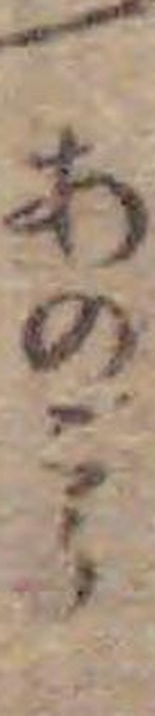あのこう
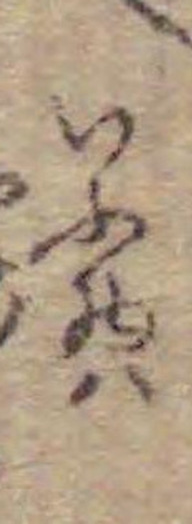いふ物は
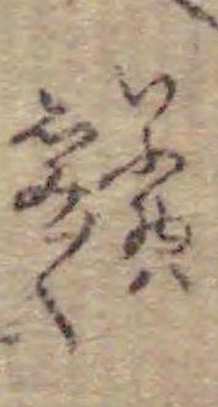いふ物は
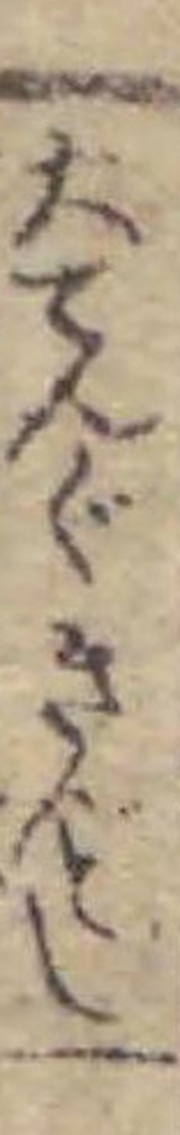大天狗きんとし
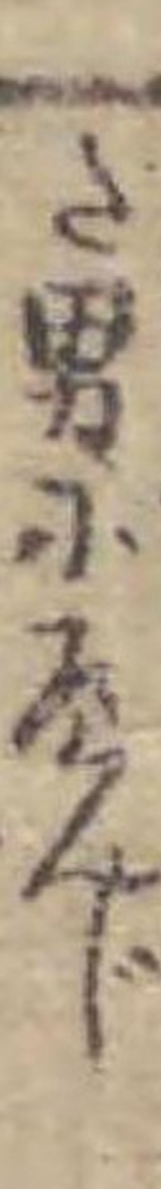た男にへんじ
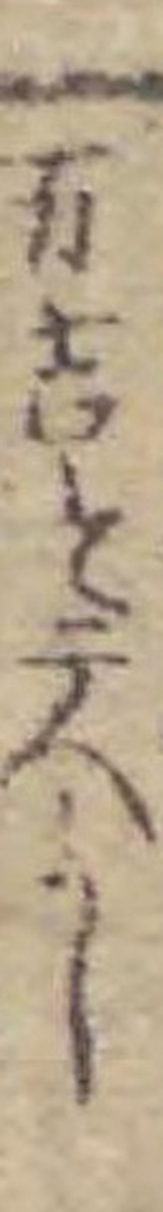万吉と二人よし
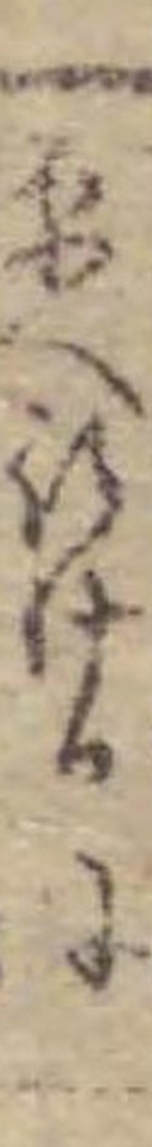原へ行けるに
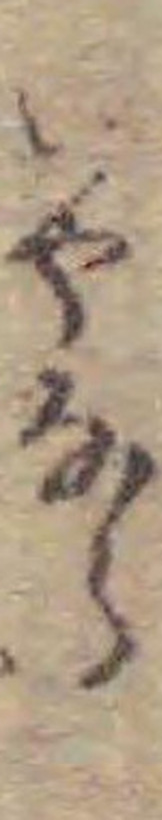いやなら
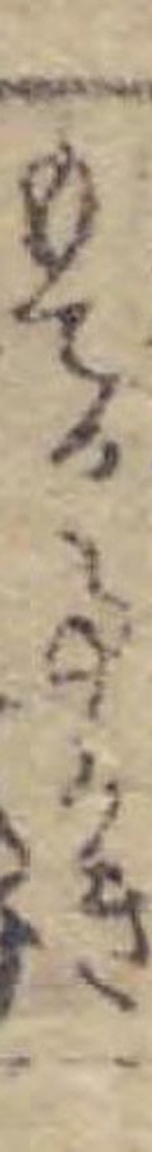もてる事かき
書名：鼻峰高慢男 : 2巻
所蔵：国立国会図書館 National Diet Library, JAPAN
